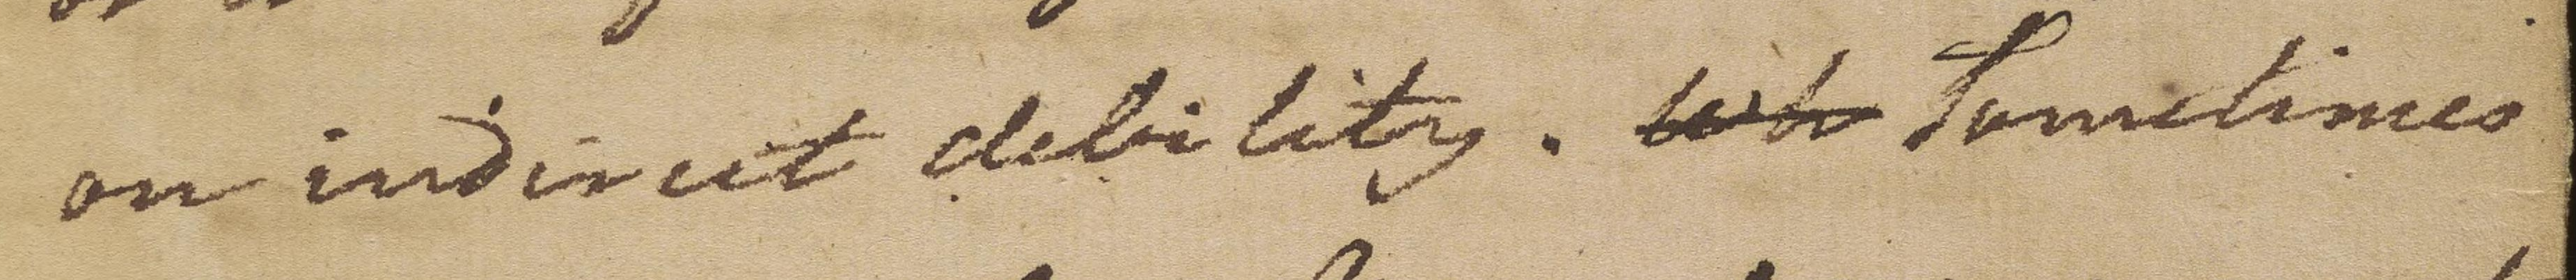on indirect debility. [Wh] Sometimes
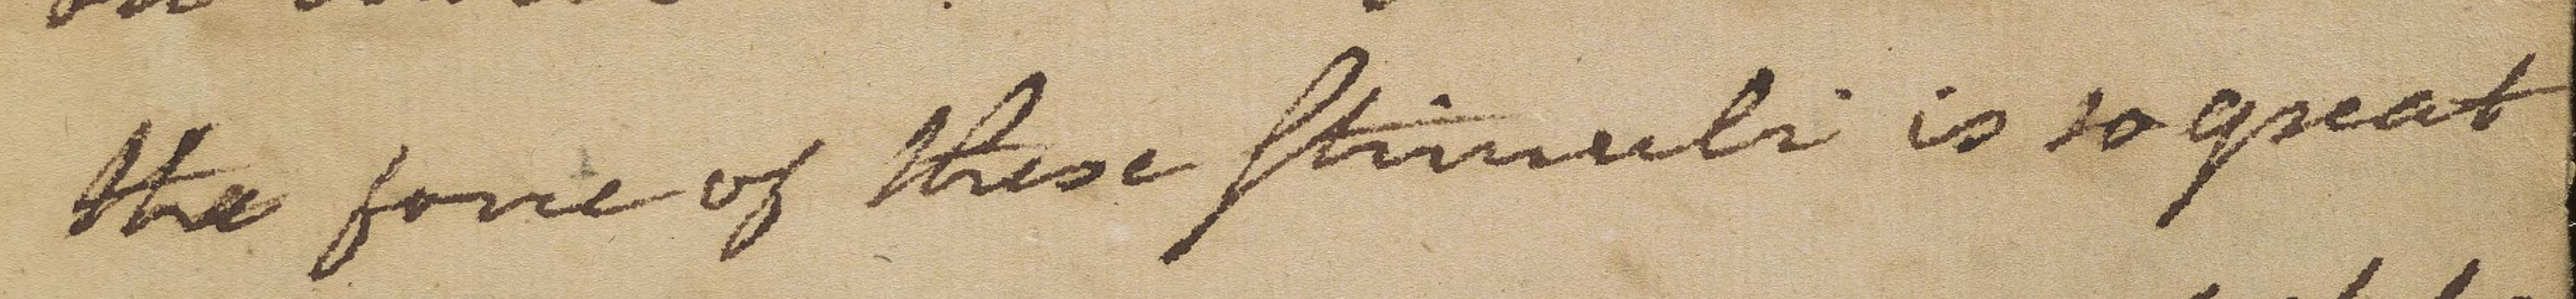the force of these Stimuli is so great
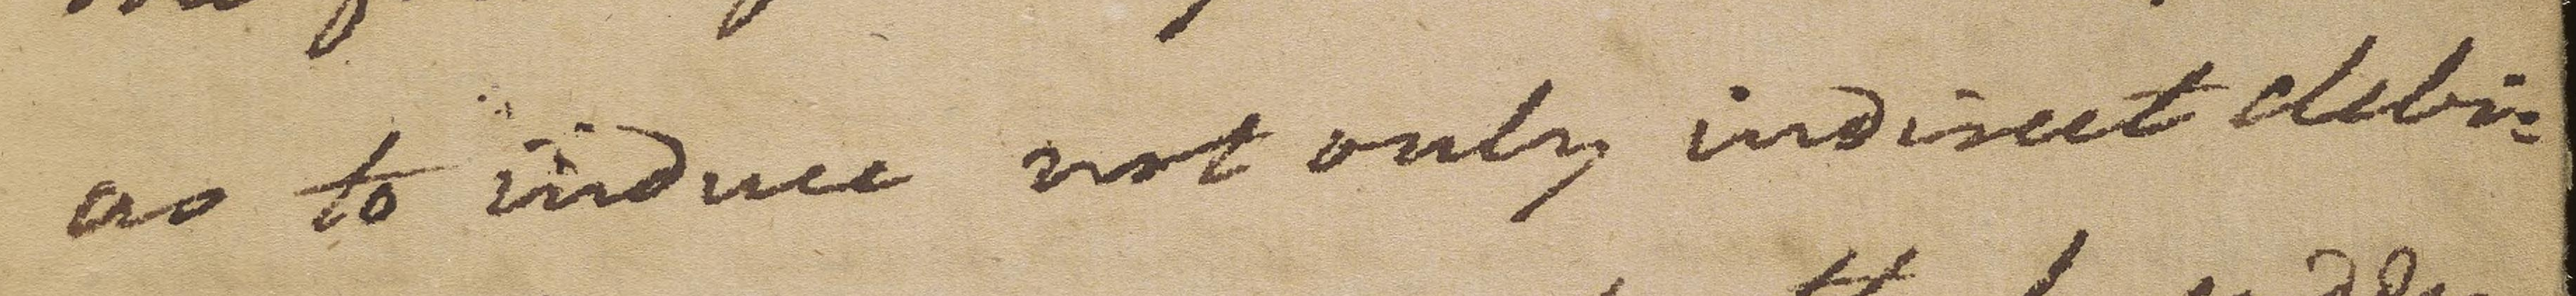as to induce not only indirect debi-
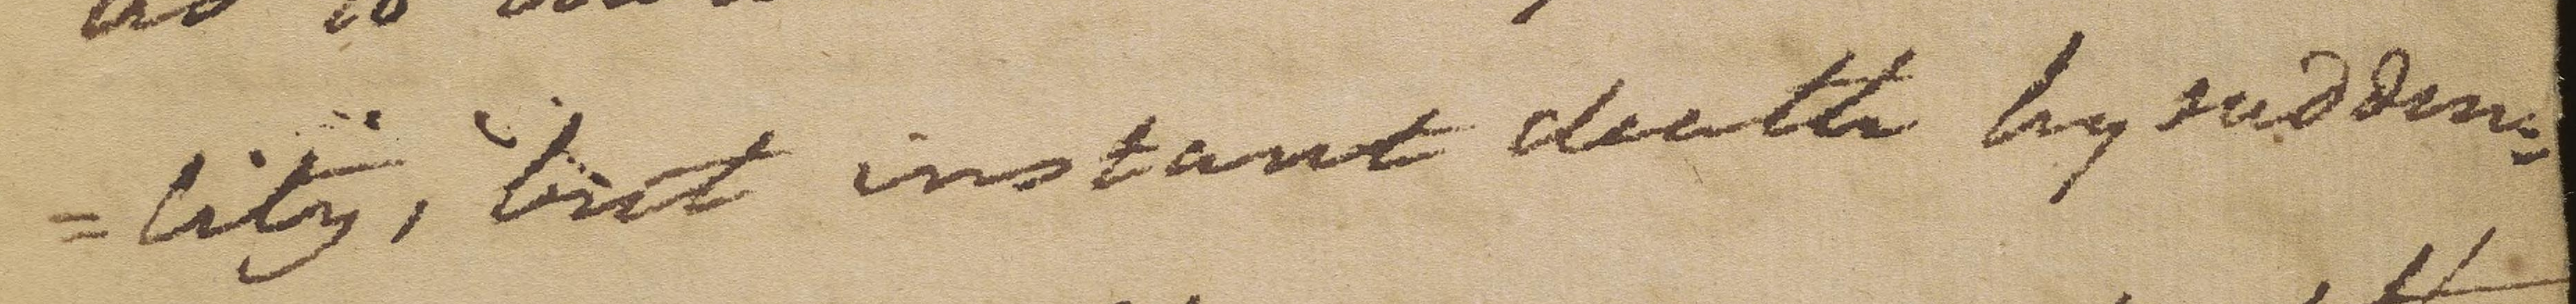-lity, but instant death by sudden-
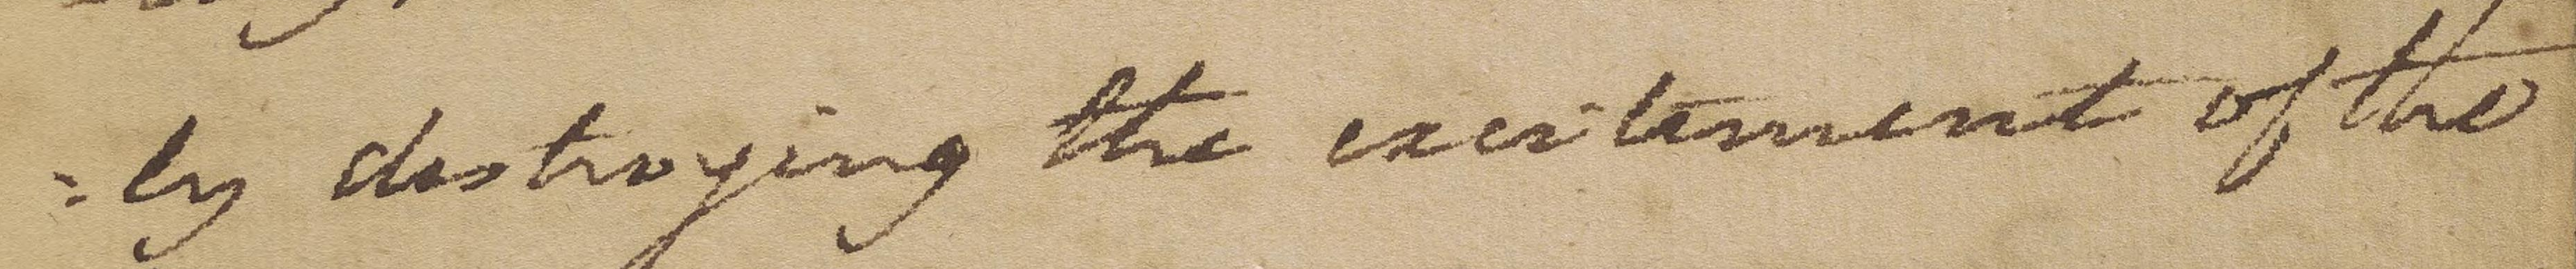-ly destroying the excitement of the
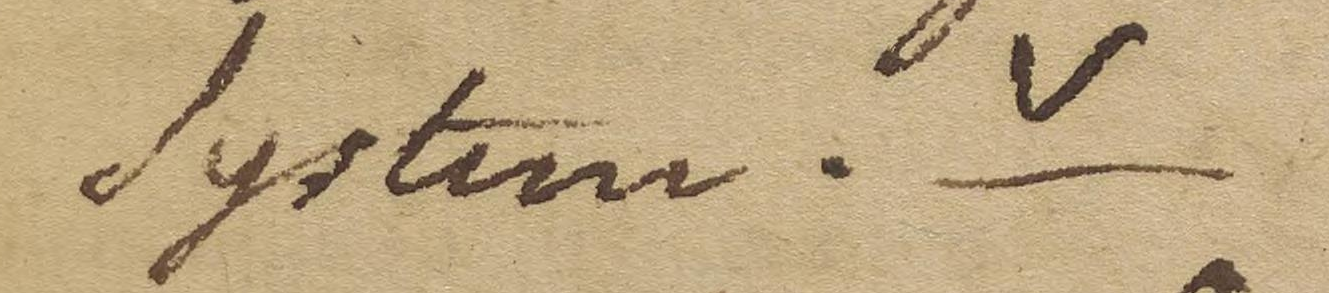System. V
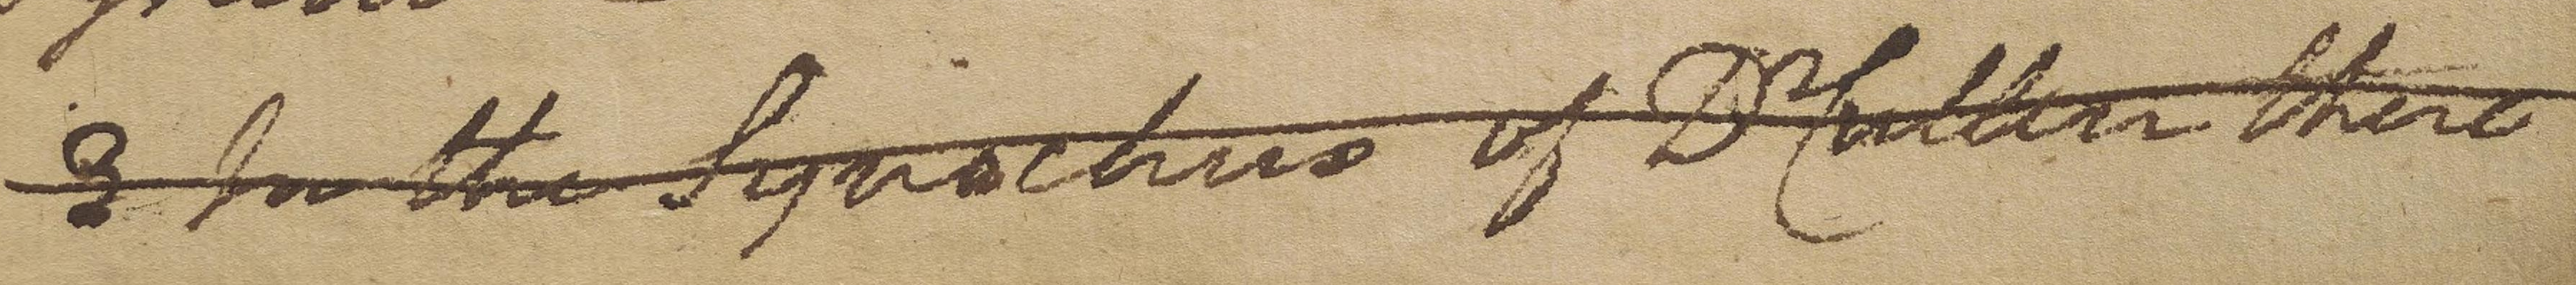[3 In the Synochus of D^r Cullen there]
